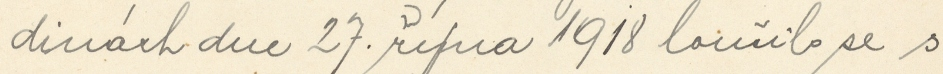dinách dne 27. října 1918 loučilo se s
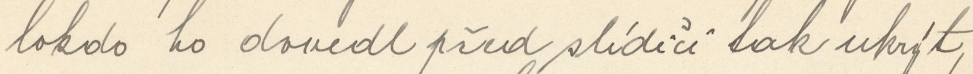lokdo ho dovedl před slídiči tak ukrýt,
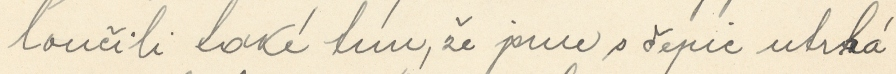loučili také tím, že jsme s čepic utrhá-
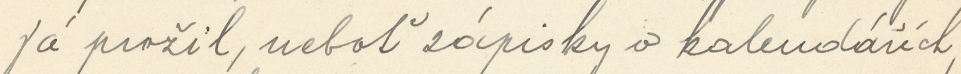já prožil, neboť zápisky v kalendářích,
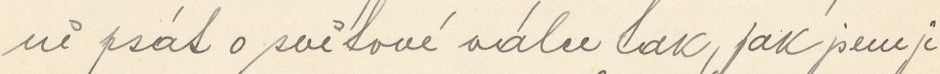ně psát o světové válce tak, jak jsem ji
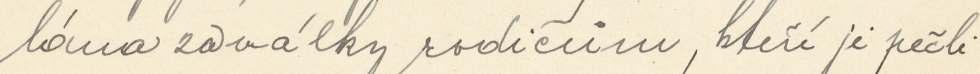lána za války rodičům, kteří ji pečli-
